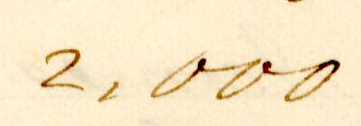2,000
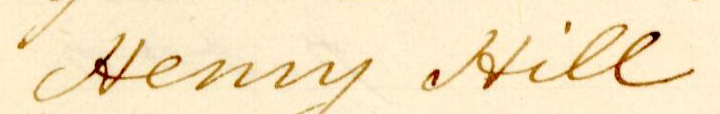Henry Hill
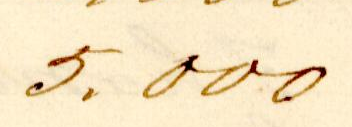5,000
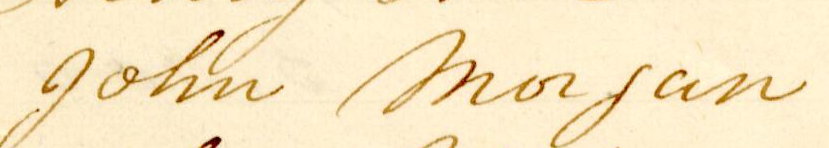John Morgan
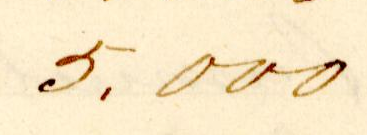5,000
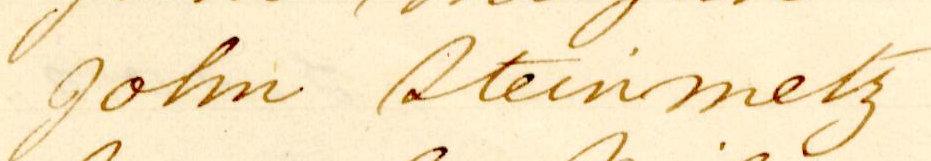John Steinmetz
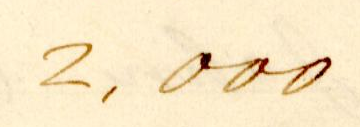2,000
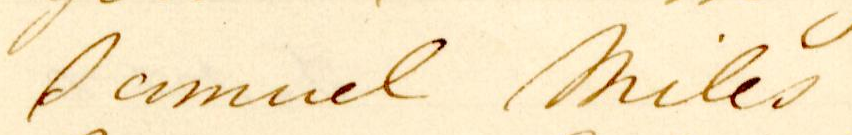Samuel Miles
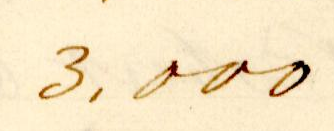3,000
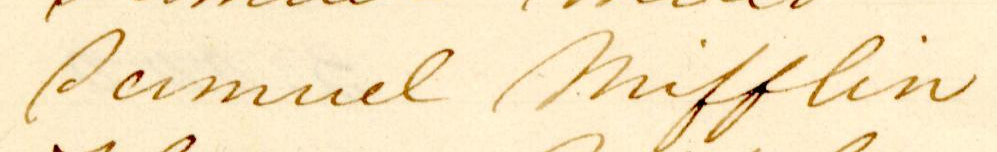Samuel Mifflin
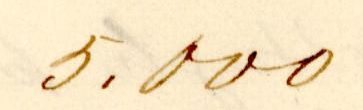5,000
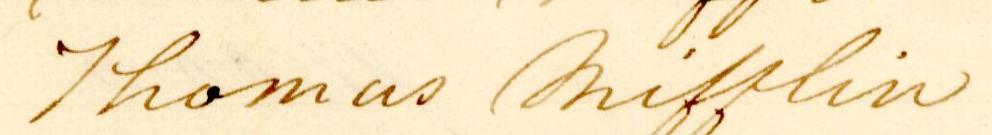Thomas Mifflin
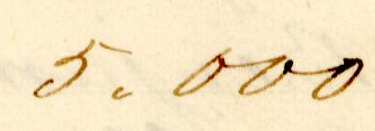5,000
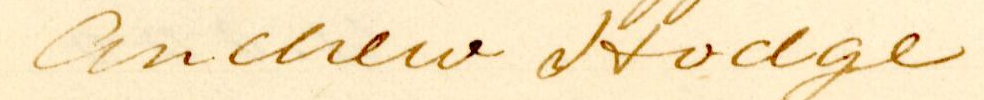Andrew Hodge
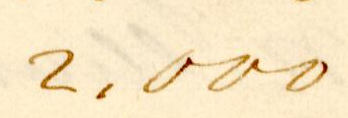2,000
